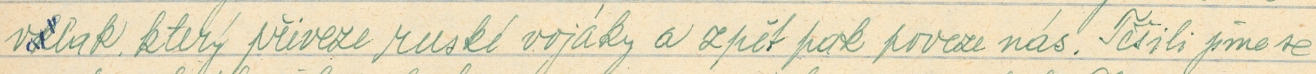vlak, který přiveze ruské vojáky a zpět pak poveze nás. Těšili jsme se
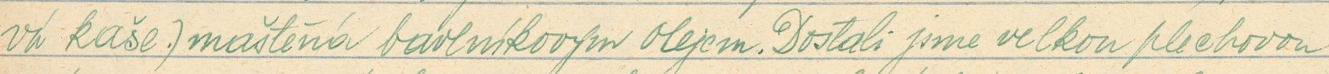vá kaše.) maštěná bavlníkovým olejem. Dostali jsme velkou plechovou
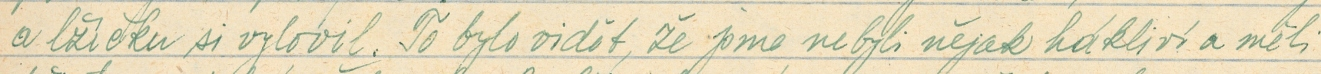a lžíčku si vylovil. To bylo vidět, že jsme nebyli nějak hákliví a měli
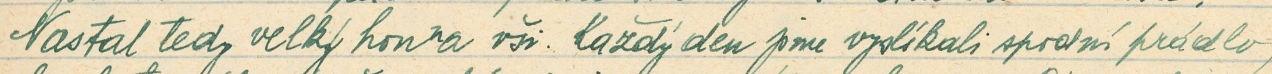Nastal tedy velký hon na vši. Každý den jsme vyslíkali spodní prádlo,
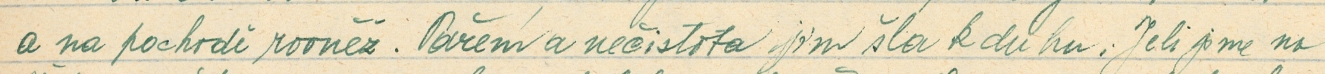a na pochodě rovněž. Paření a nečistota jim šla k duhu. Jeli jsme na
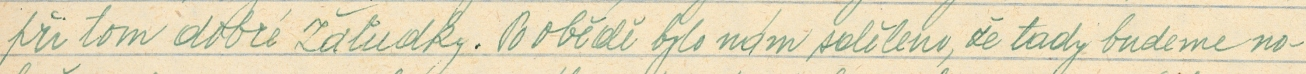při tom dobré žaludky. Po obědě bylo nám sděleno, že tady budeme na-
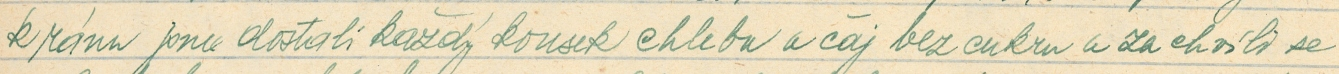k ránu jsme dostali každý kousek chleba a čaj bez cukru a za chvíli se
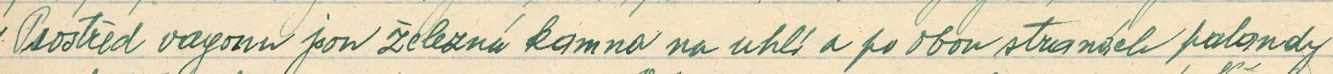Prostřed vagonu jsou železná kamna na uhlí a po obou stranách palandy
